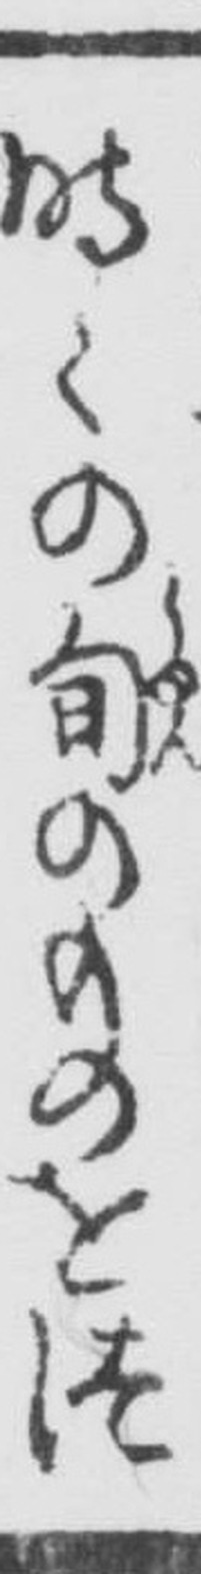時々の旬のものをつ
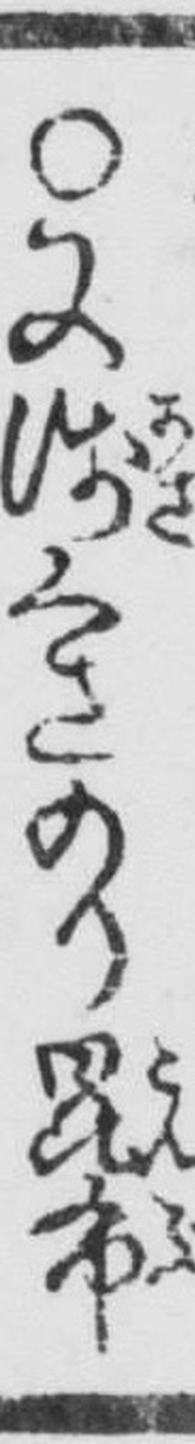○又浅くさのり昆布
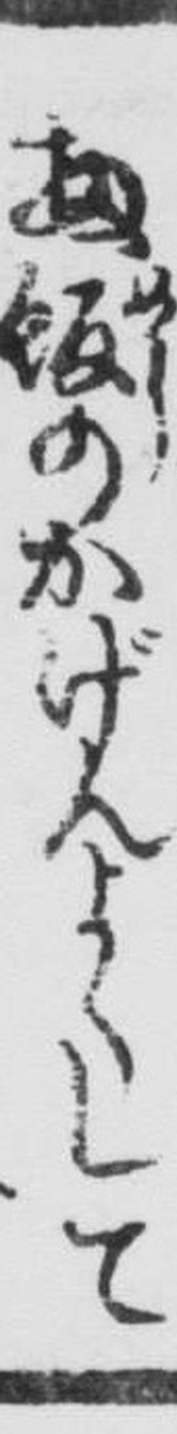扨飯のかげんよくして
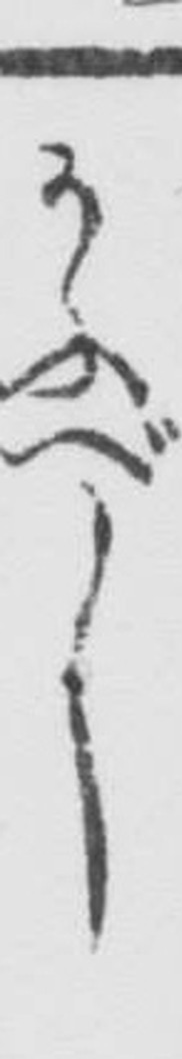かふべし
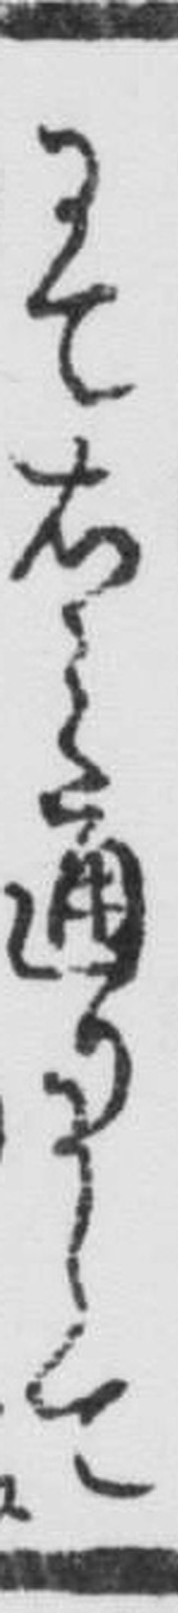にて右之通りにして
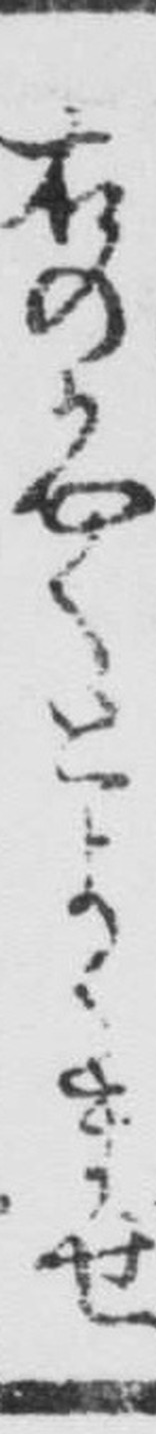右のかやくとよくまぜ
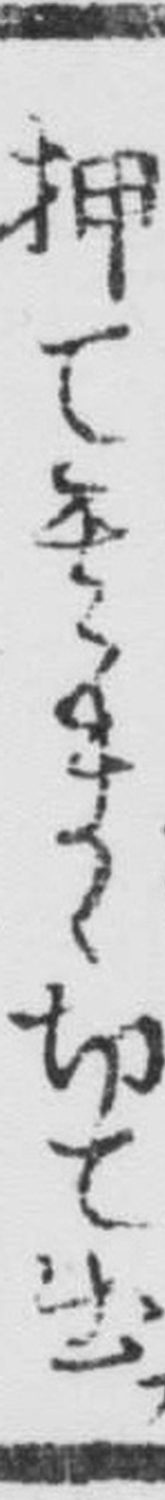押て其まゝ切て出す
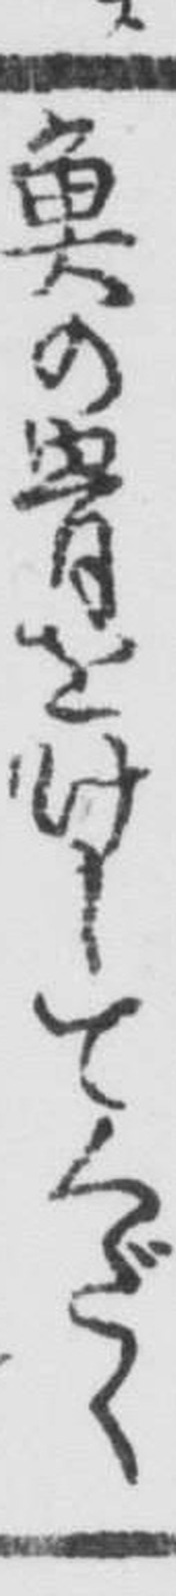魚の骨をけしてくだく
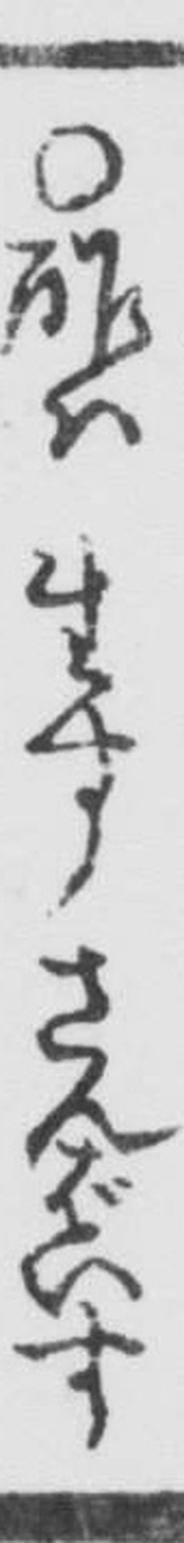○酢は生すさんばいす
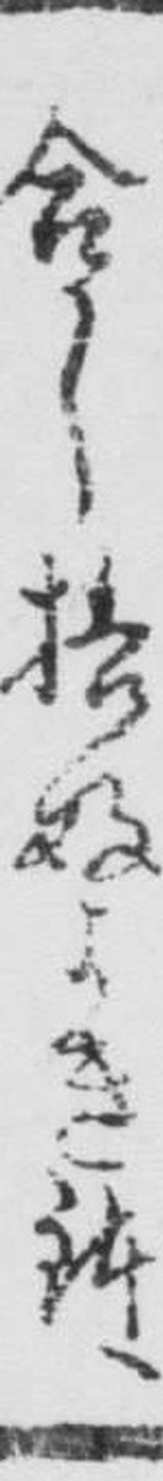合し格好よき鉢へ
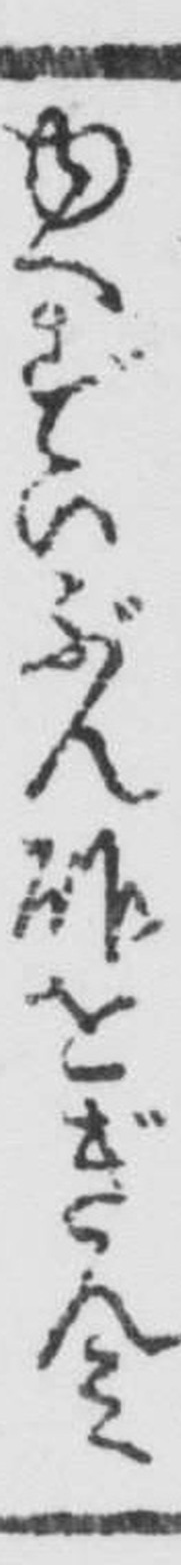ゆへずいぶん酢をぎんみ
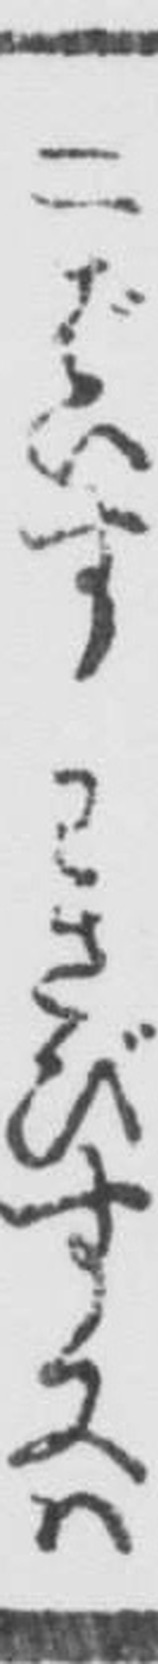二ばいすわさびす又は
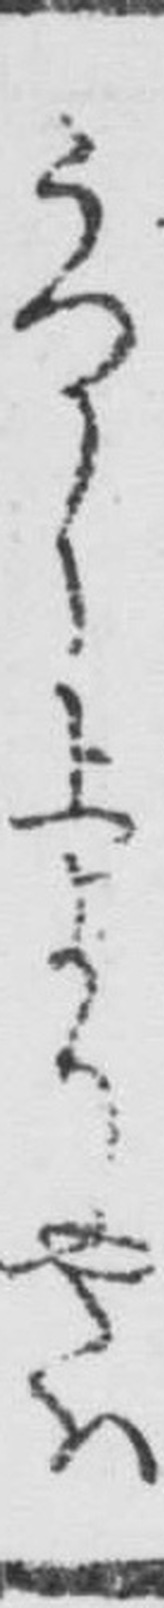うつし上よりやは
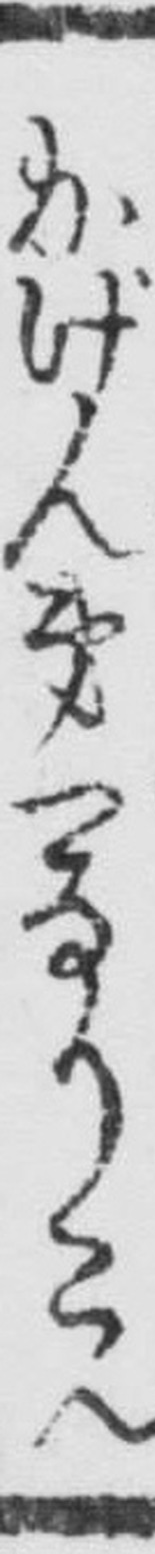かげん第一なりこん
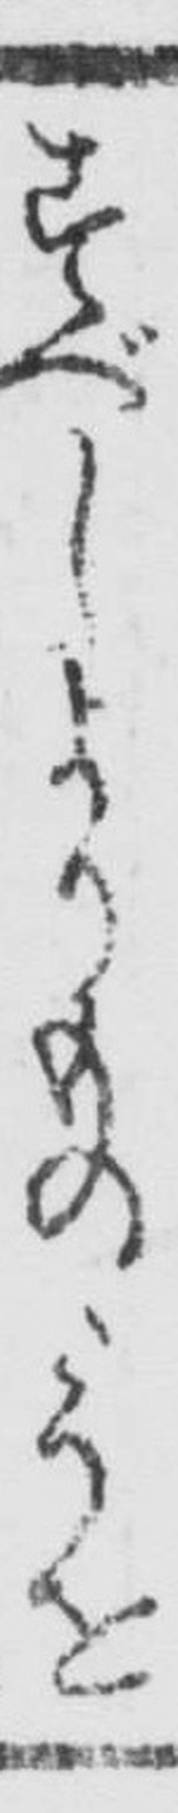すべしよりものゝうを
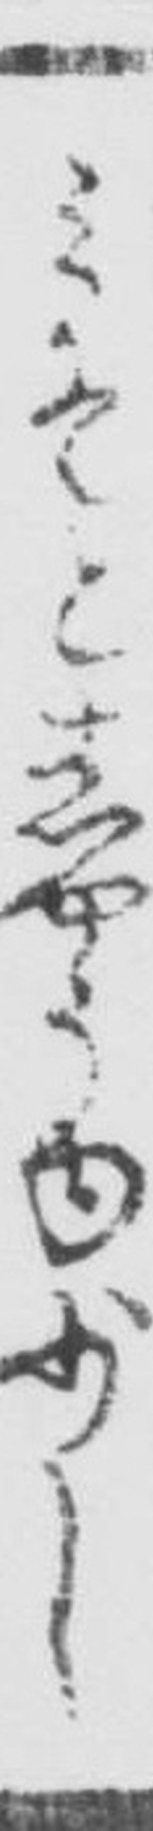みそとしやうゆ少し
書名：諸家通用/即席料理
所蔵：大阪府立大学学術情報センター 国文学研究資料館
